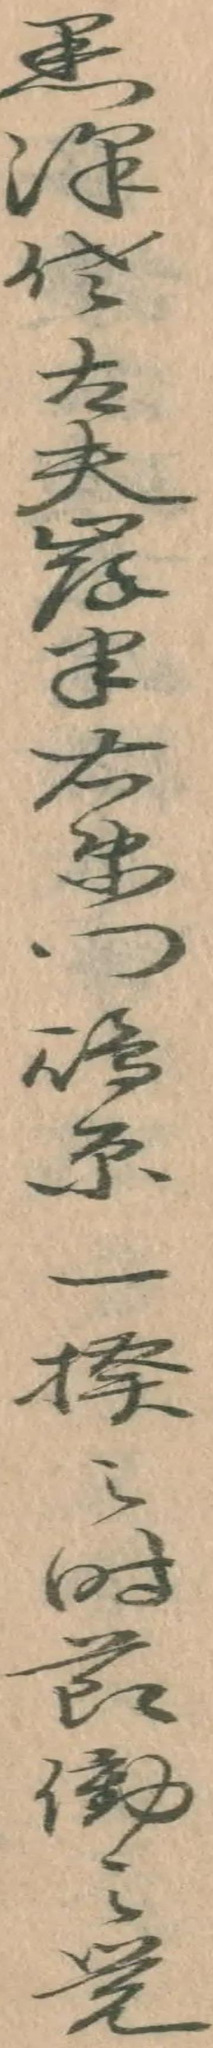黒沢佐太夫岸半右衛門島原一揆之時節働之覚
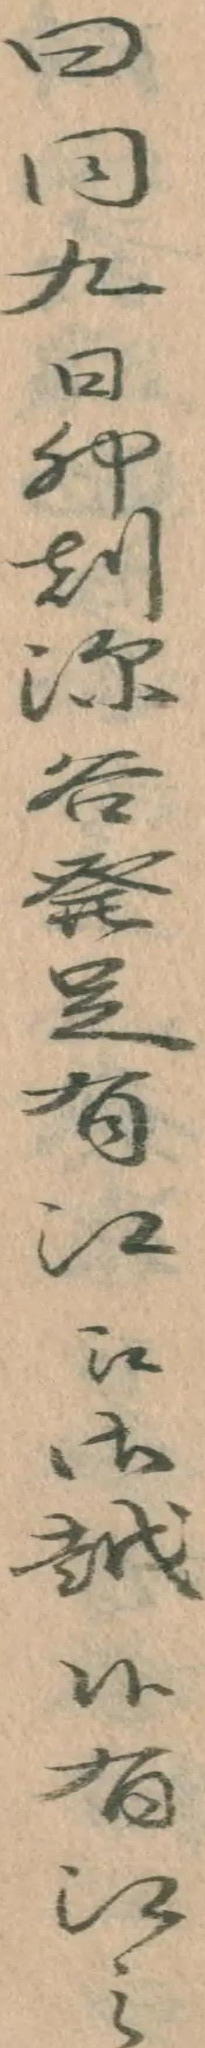曰同九日夘刻深谷発足有江被御越候有江之
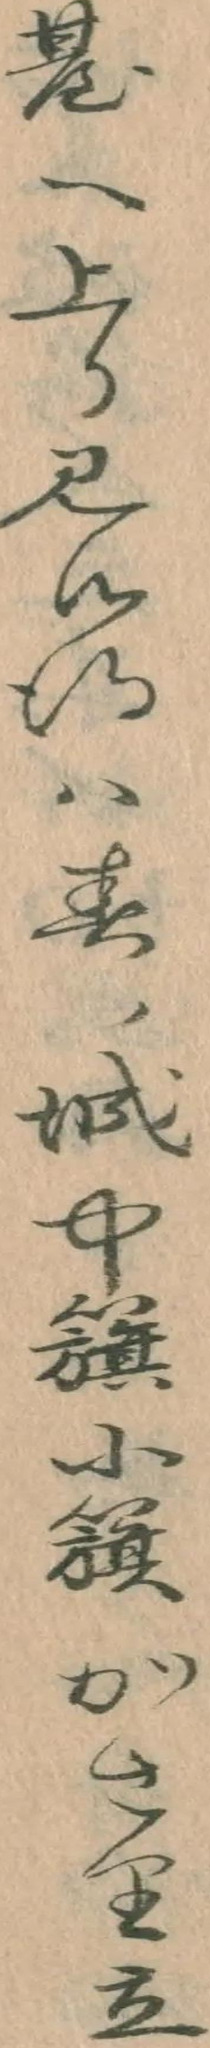台へ上り見候得は春之城中籏小籏加さ里立
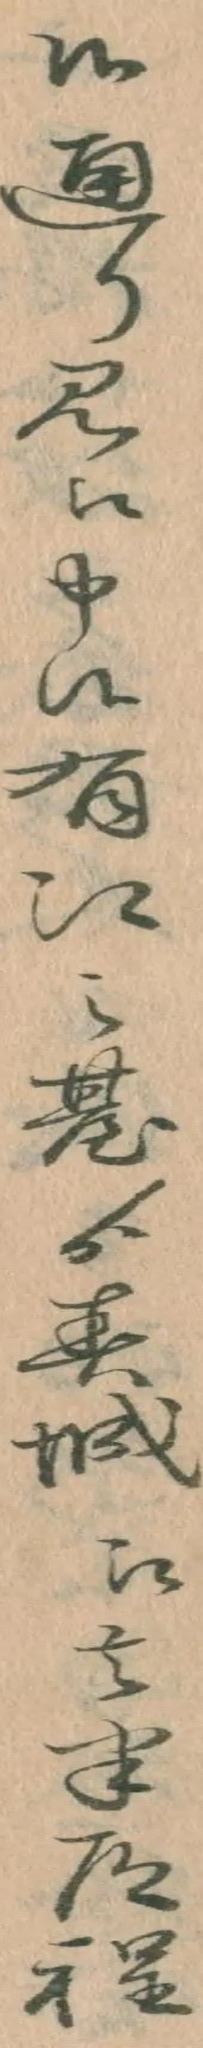候通り見江申候有江之台ゟ春城江者半道程
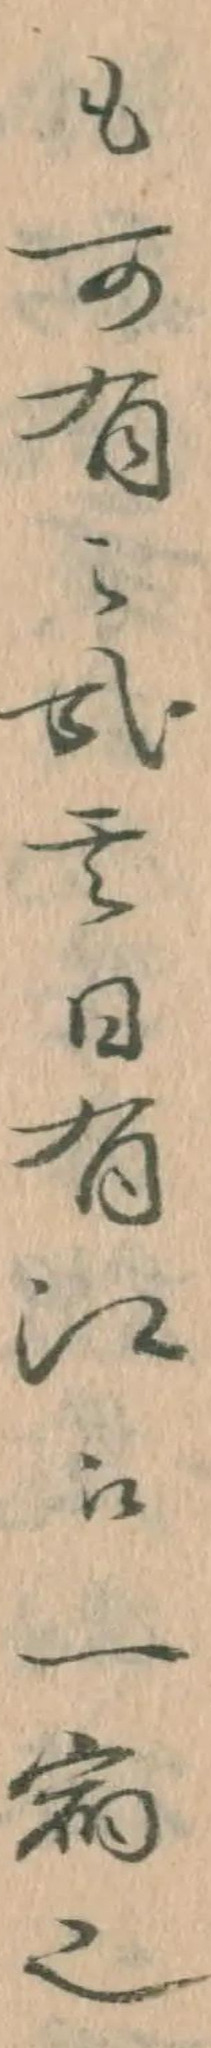も可有之哉其日有江被一宿也
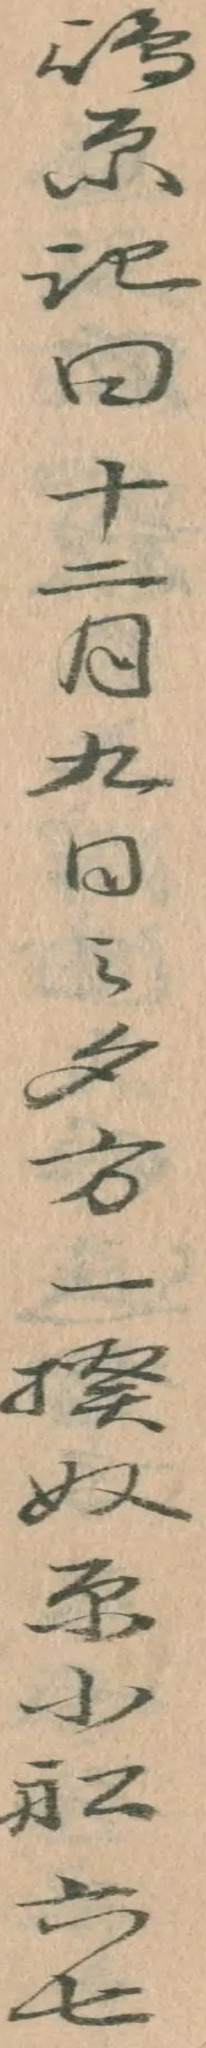島原記曰十二月九日之夕方一揆奴原小舩六七
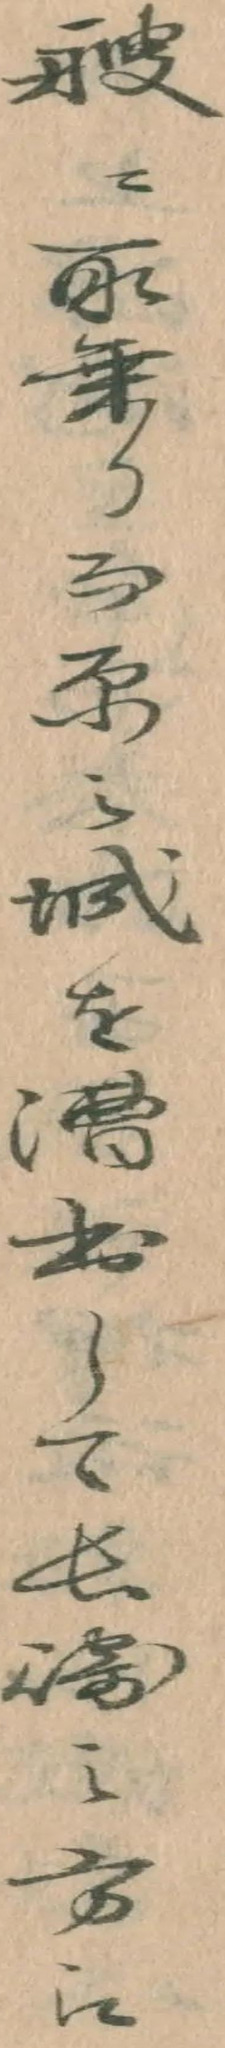艘に取乗り而原之城を漕出して長崎之方江
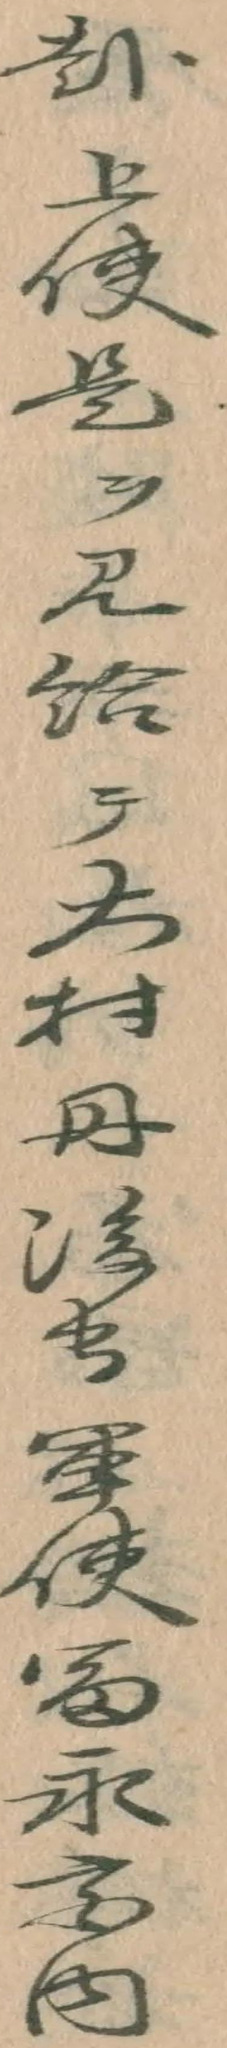赴上使是を見給て大村丹後守軍使冨永宮内
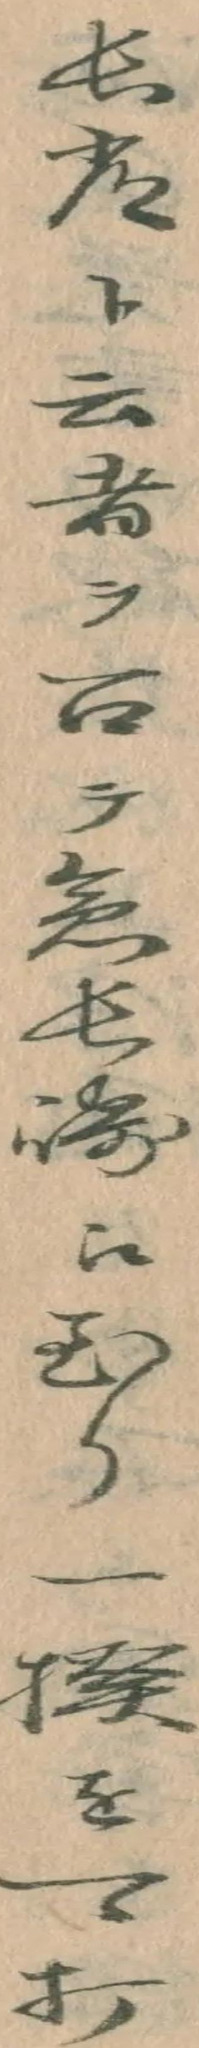長常と云者を召て急長崎江至り一揆を可打
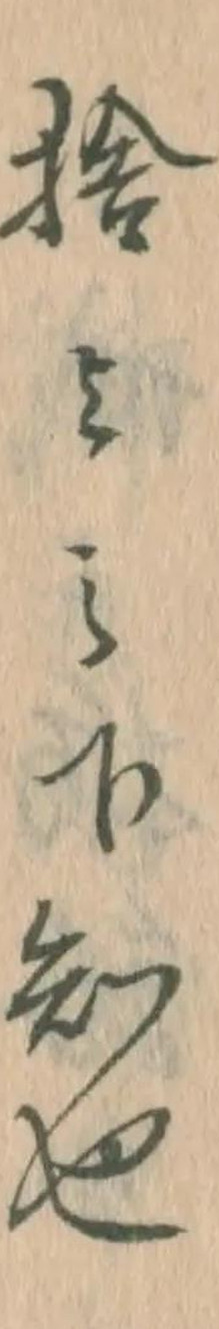捨与之下知也
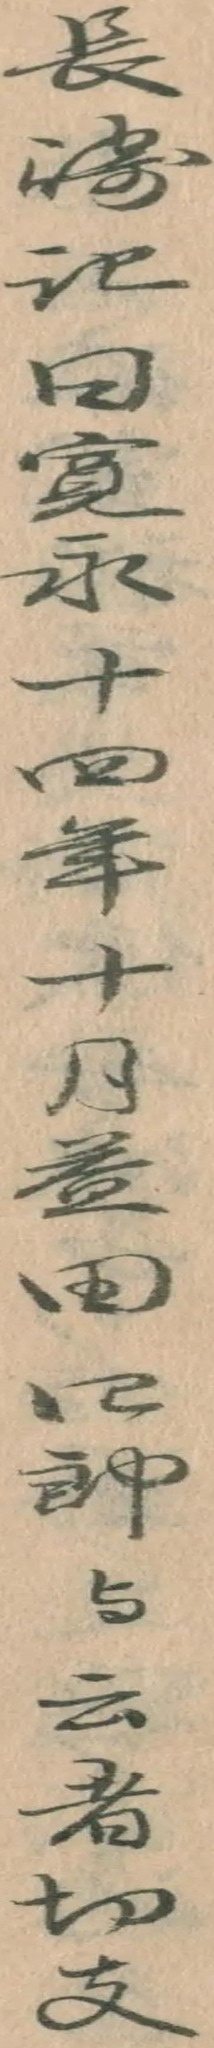長崎記曰寛永十四年十月益田四郎与云者切支
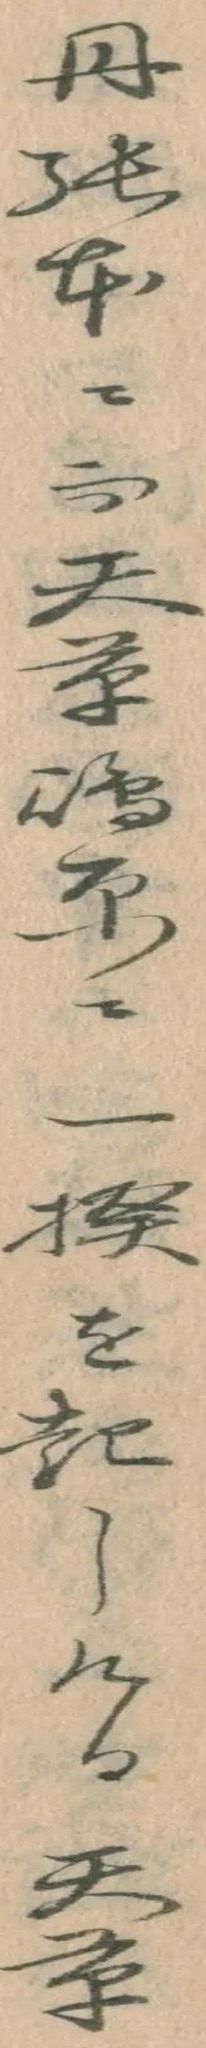丹張本に而天草島原に一揆を起しける天草
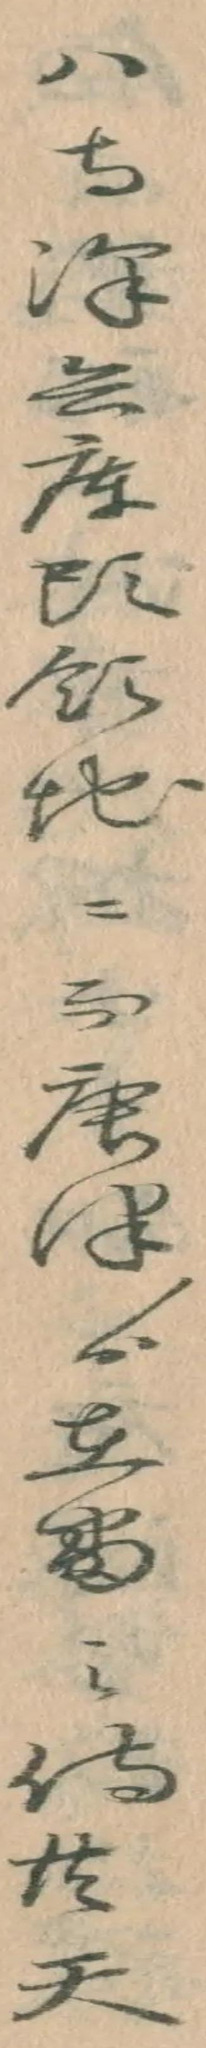は寺沢兵庫頭領地に而唐津ゟ在番之侍共天
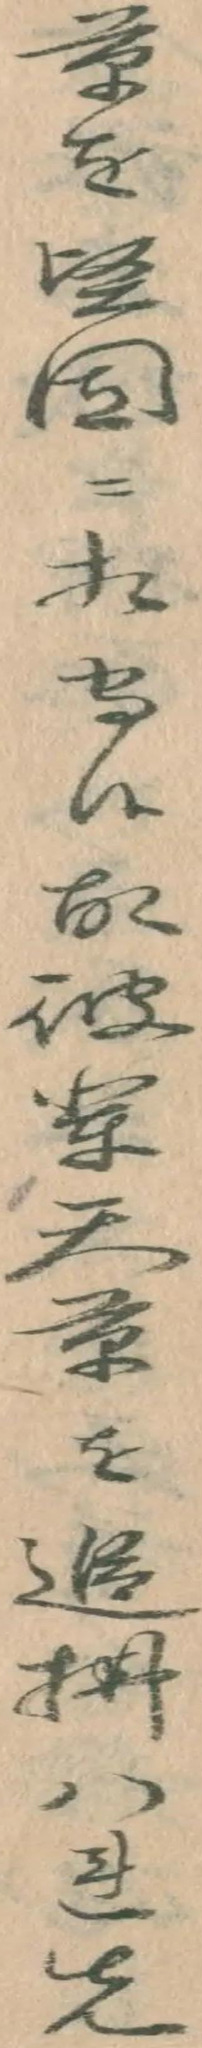草を堅固に相守候故彼輩天草を追払は連先

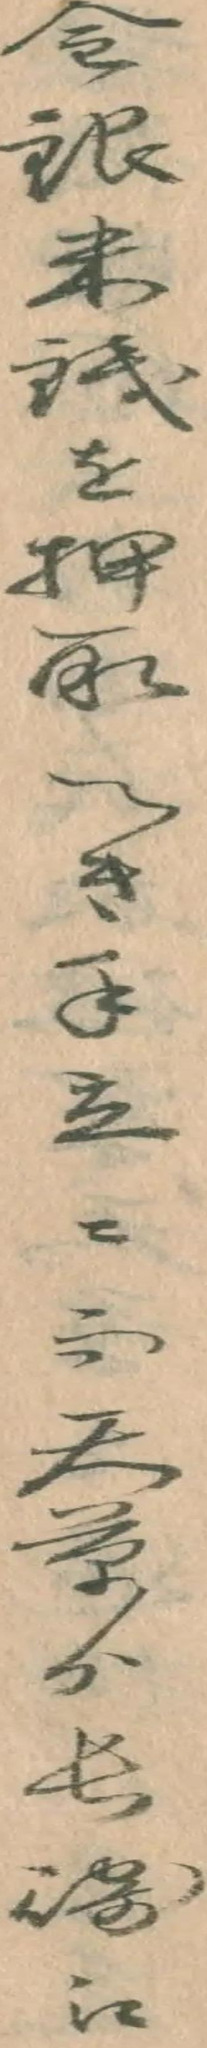金銀米銭を押取へき手立に而天草ゟ長崎江
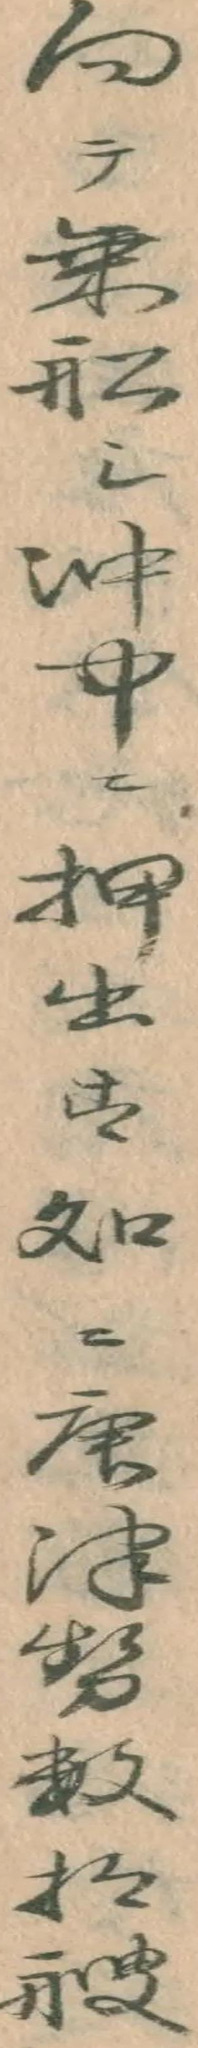向て乗舩し沖中に押出春処に唐津勢数拾艘
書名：切支丹御退治記 49巻. [4]
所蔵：国立国会図書館 National Diet Library, JAPAN
